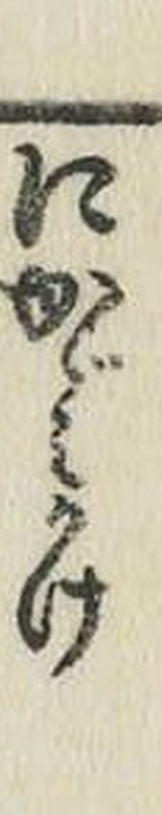にかゞみかけ
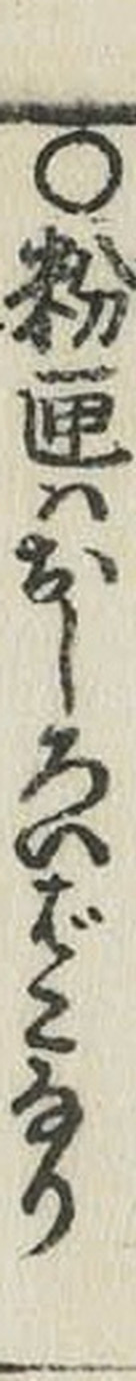○粉匣はおしろいばこなり
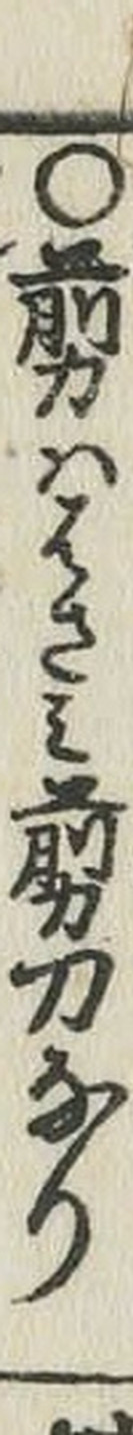○剪ははさみ剪刀なり
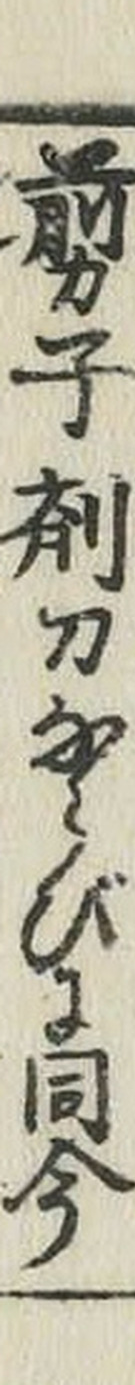剪子剤刀ならびに同今
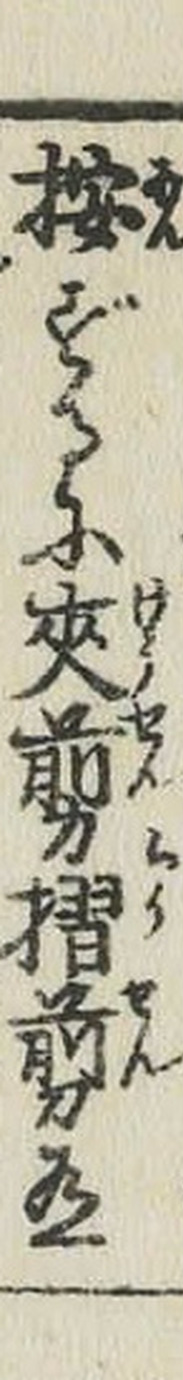按ずるに夾剪摺剪有
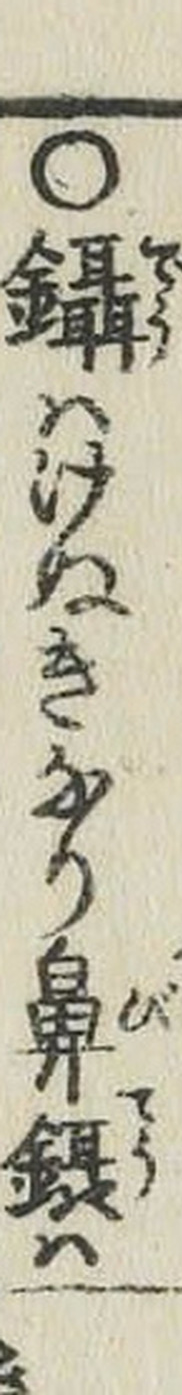○鑷はけぬきなり鼻鑷は
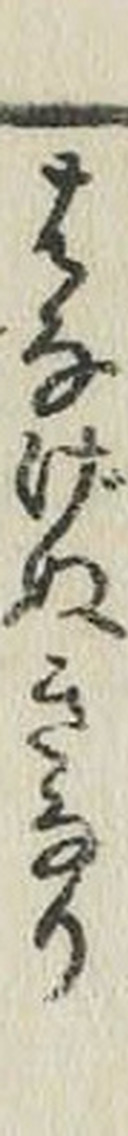はなげぬきなり
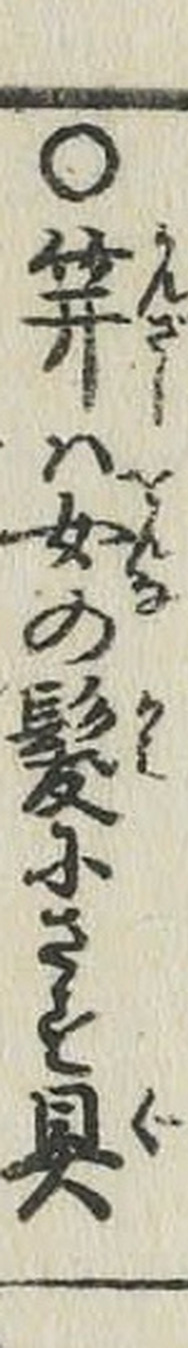○笄は女の髪にさす具
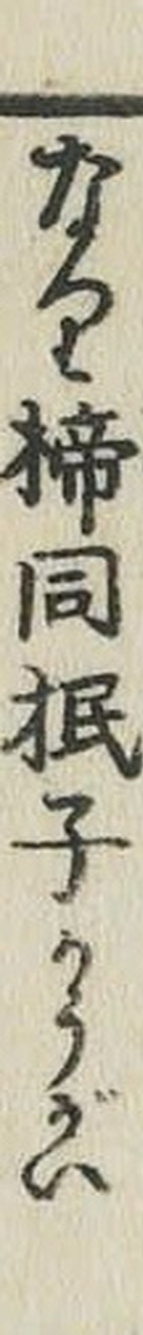なり楴同抿子かうがい
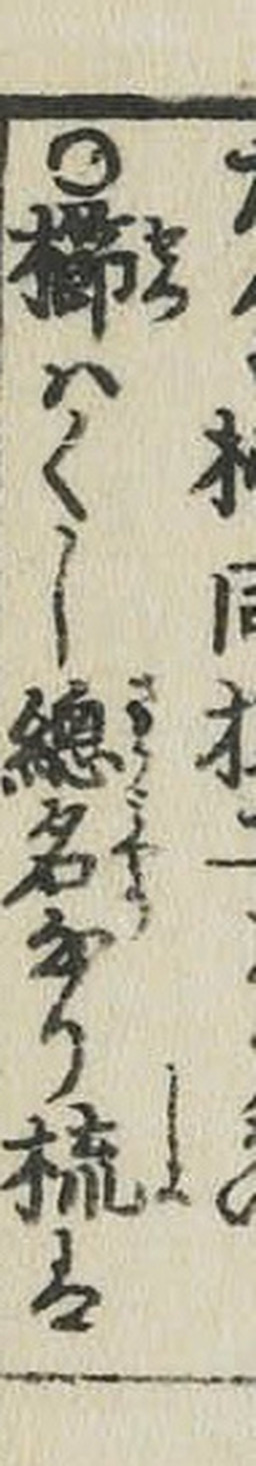○櫛はくし総名なり梳は

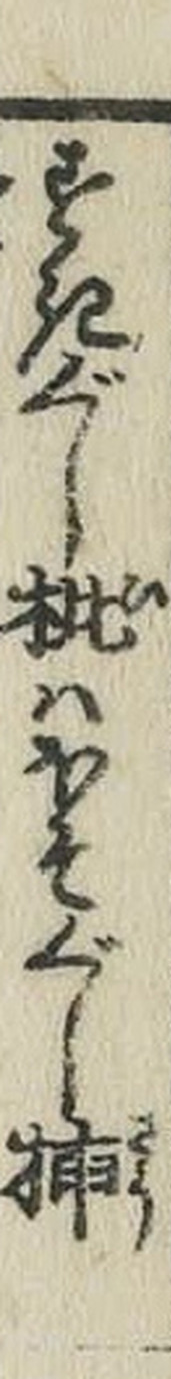すきぐし枇はほそぐし挿
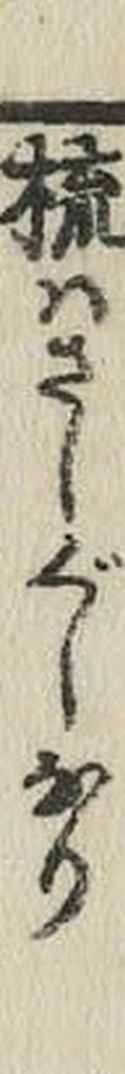梳はさしぐしなり
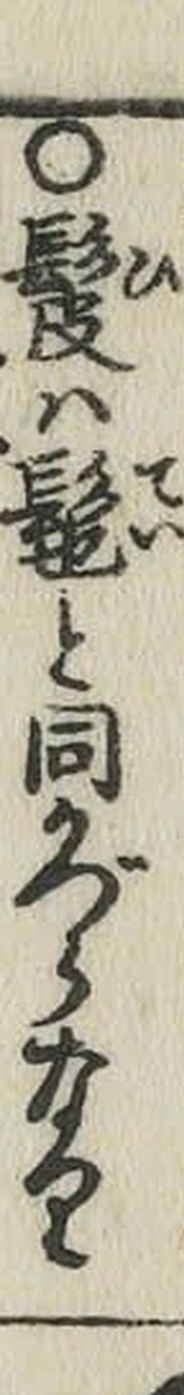○髲は髢と同かづらなり
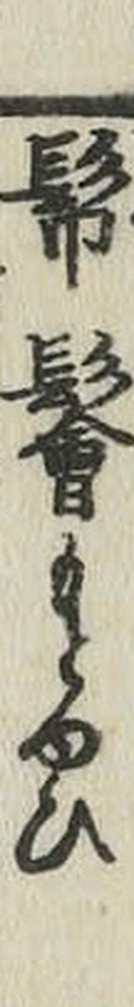𩫹鬙もとゆひ
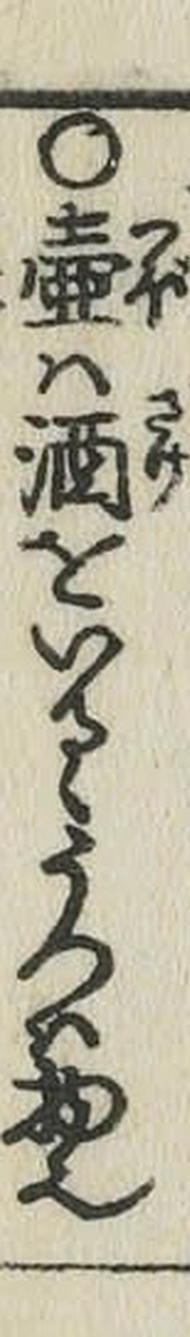○壺は酒をいるゝうつは物也
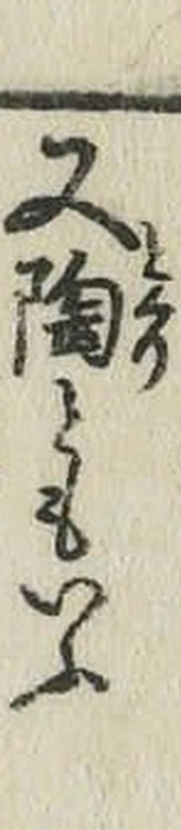又陶ともいふ
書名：増補頭書訓蒙図彙大成 10巻 5:巻之9-11
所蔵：東京学芸大学教育コンテンツアーカイブ
